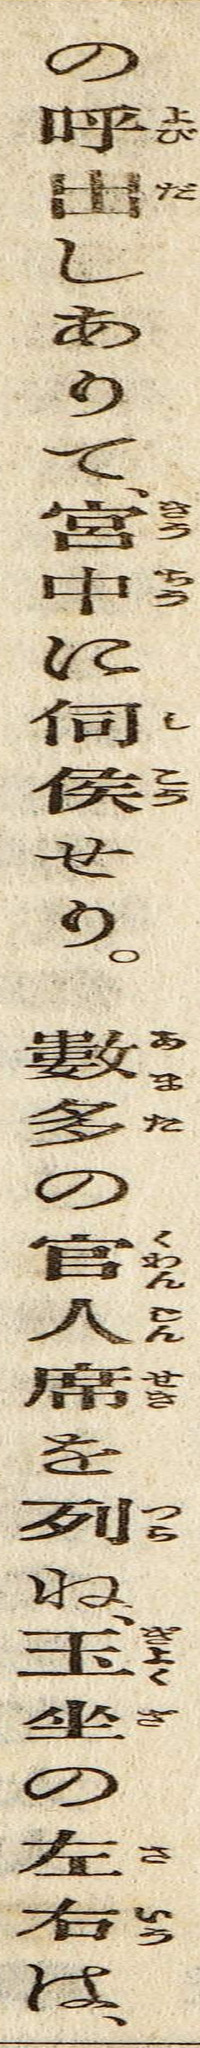の呼出しありて、宮中に伺候せり。数多の官人席を列ね、玉坐の左右は、
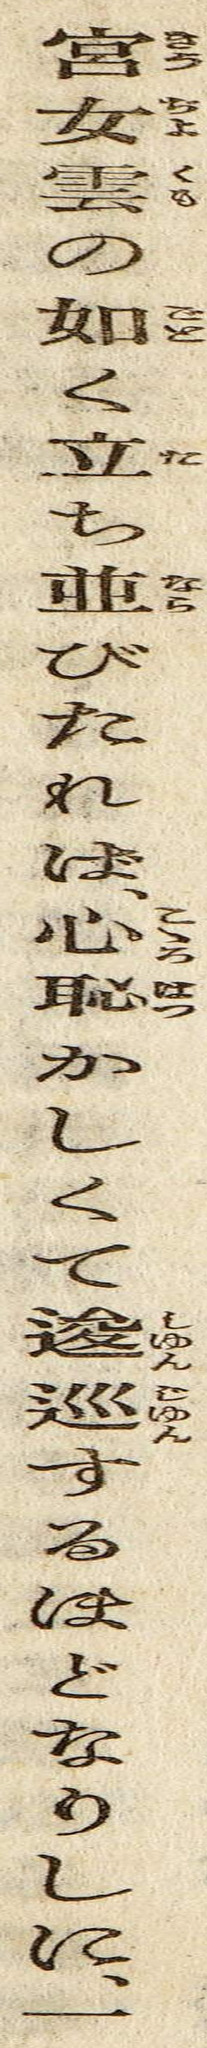宮女雲の如く立ち並びたれば、心恥かしくて逡巡するほどなりしに、一

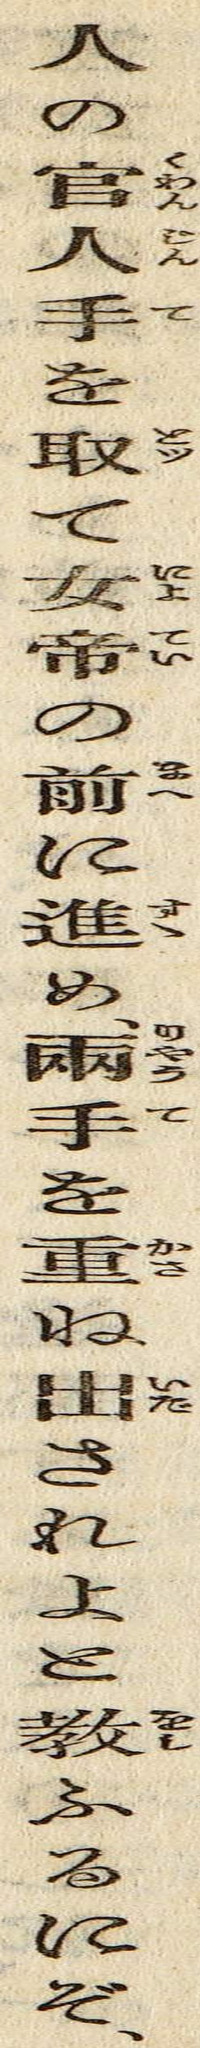人の官人手を取て女帝の前進め、両手を重ね出されよと教ふるにぞ、
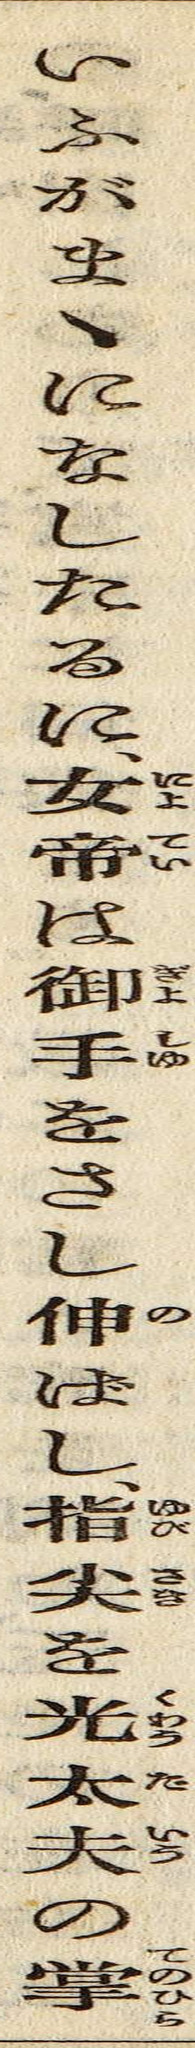いふがまゝになしたるに、女帝は御手をさし伸ばし、指尖を光太夫の掌
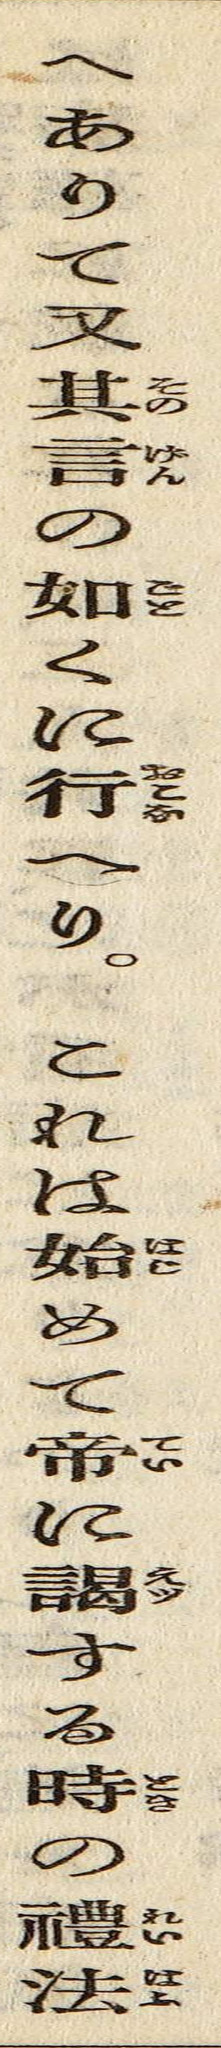へありて又其言の如くに行へり。これは始めて帝に謁する時の礼法
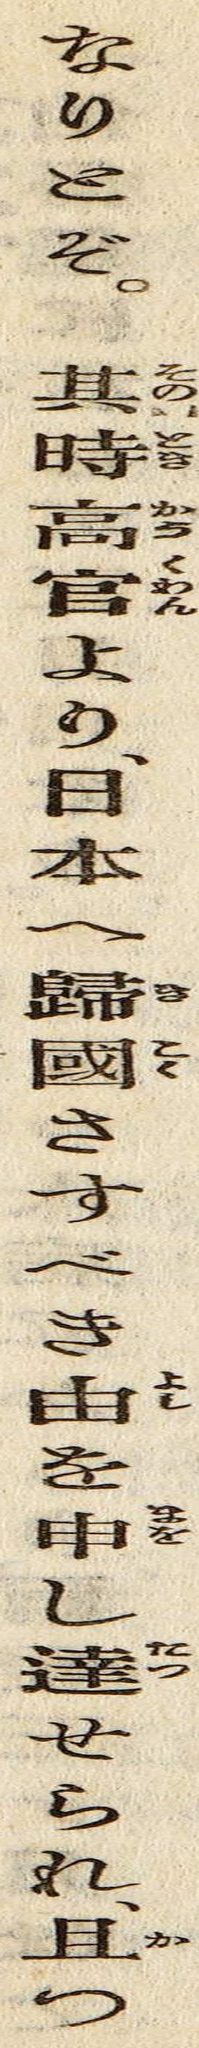なりとぞ。其時高官より、日本へ帰国さすべき由を申し達せられ、且つ
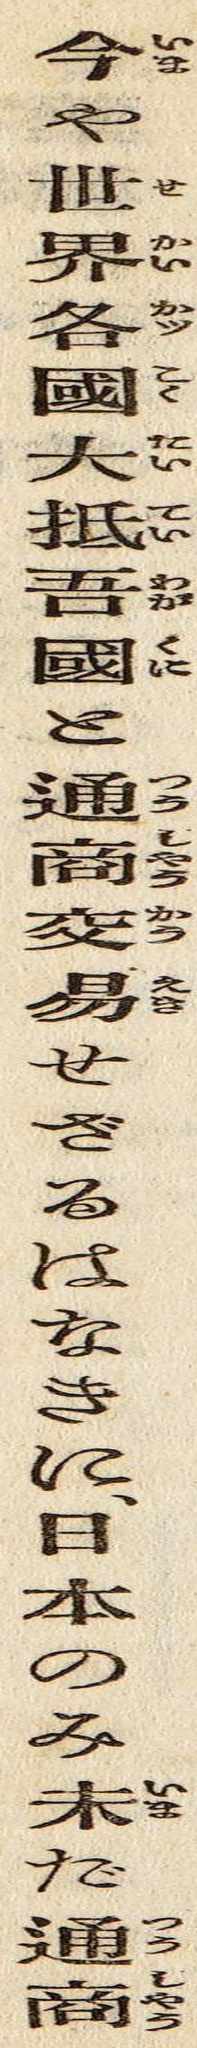今や世界各国大抵吾国と通商交易せざるはなきに、日本のみ未だ通商
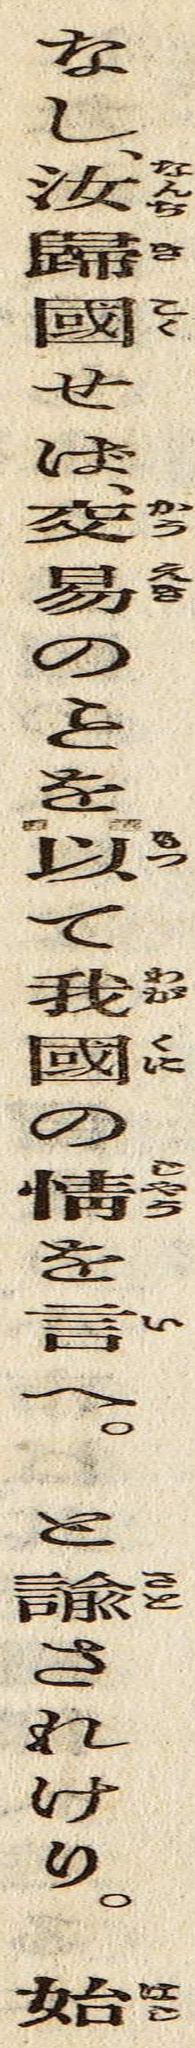なし、汝帰国せば、交易のことを以て我国の情を言へ。と諭されけり。始
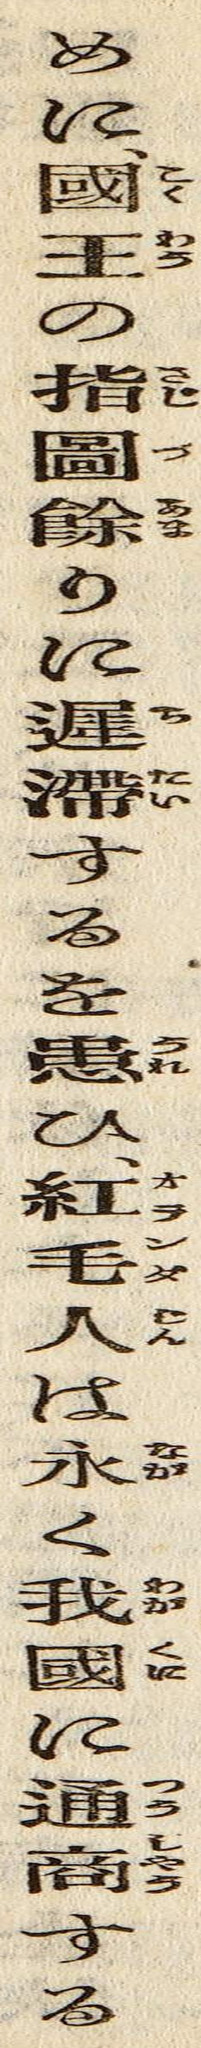めに、国王の指図余りに遅滞するを患ひ、紅毛人は永く我国に通商する
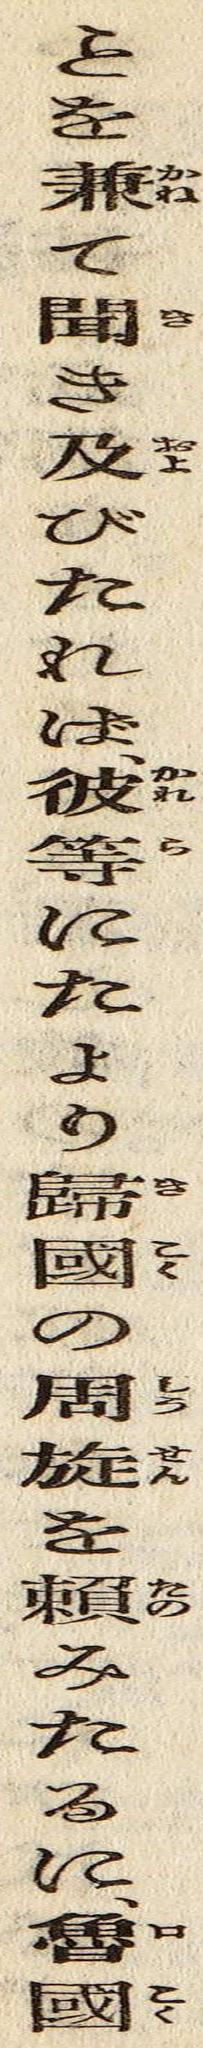ことを兼て聞き及びたれば、彼等にたより帰国の周旋を頼みたるに、魯国
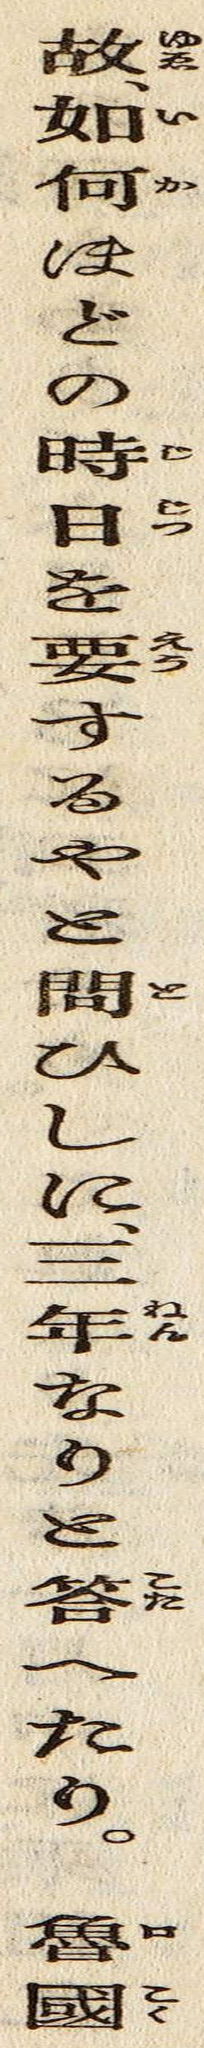故、如何ほどの時日を要するやと問ひしに、三年なりと答へたり。魯国
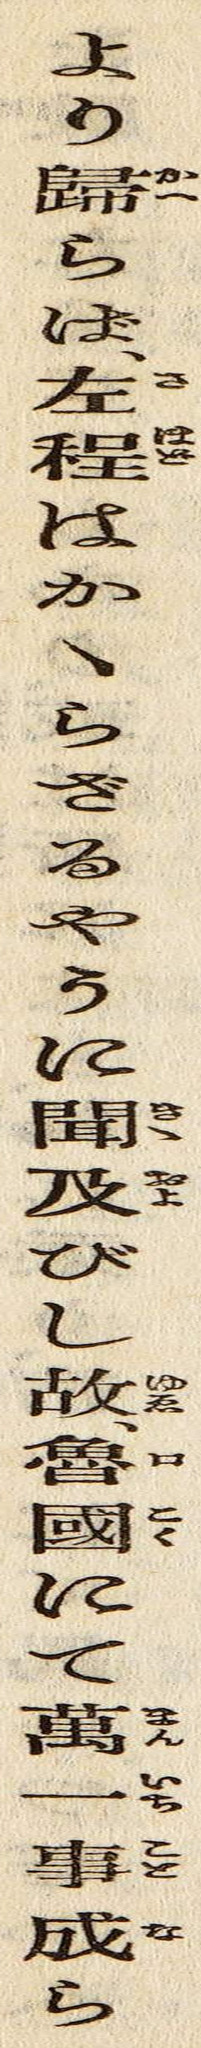より帰らば、左程はかゝらざるやうに聞及びし故、魯国にて萬一事成ら
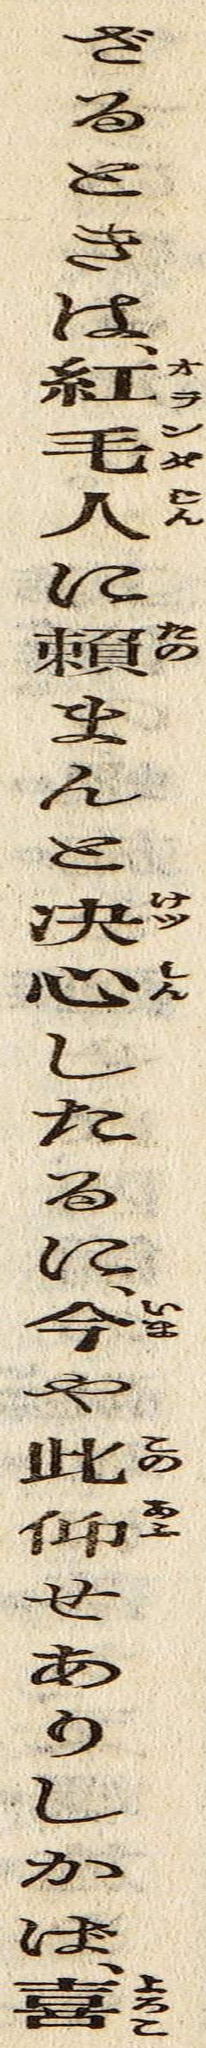ざるときは、紅毛人に頼まんと決心したるに、今や此仰せありしかば、喜
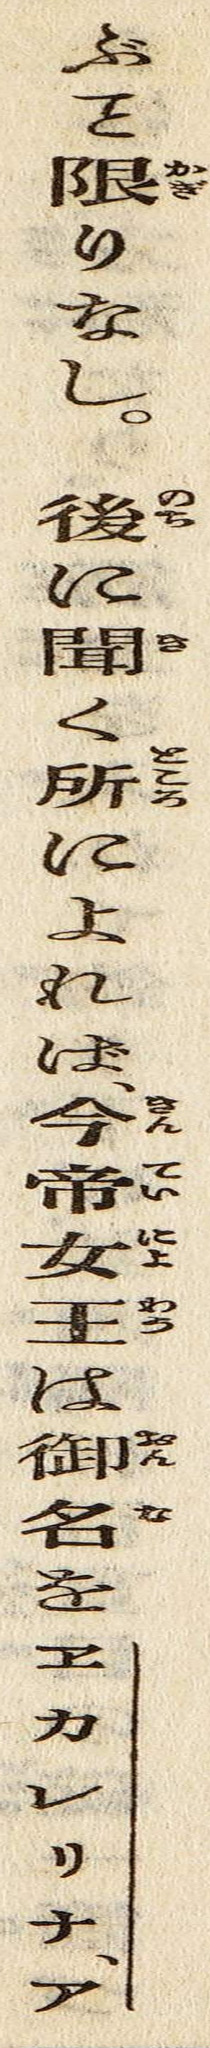ぶこと限りなし。後に聞く所によれば、今帝女王は御名をエカレリナ、ア
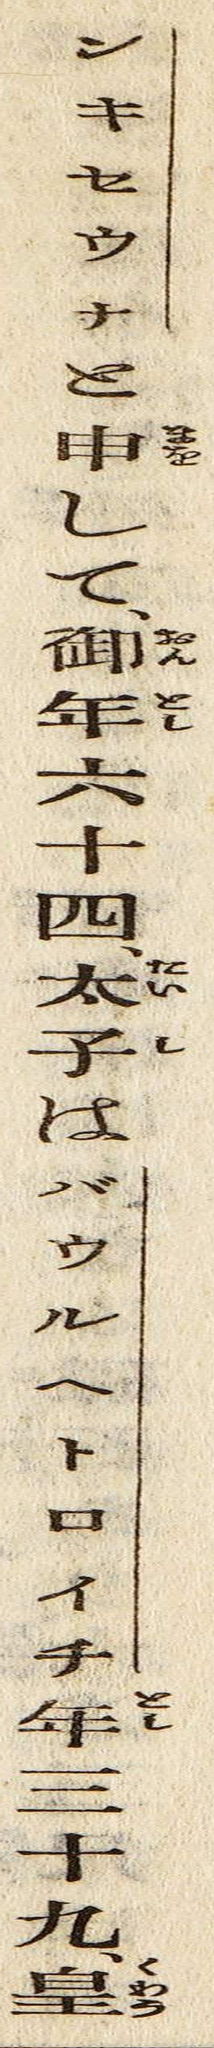ンキセウナと申して、御年六十四、太子はバウルヘトロイチ年三十九、皇
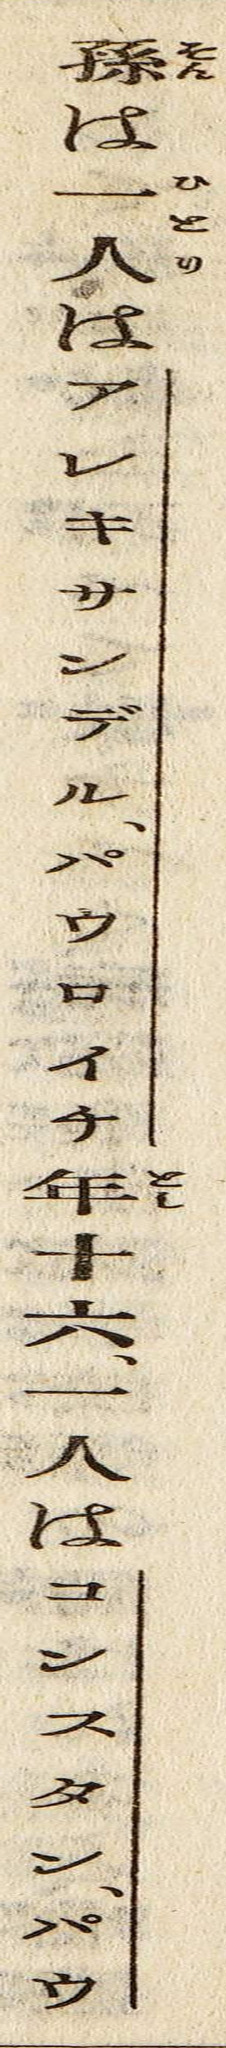孫は一人はアレキサンデル、パウロイチ年十六、一人はコンスタン、パウ
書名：日本漂流譚
